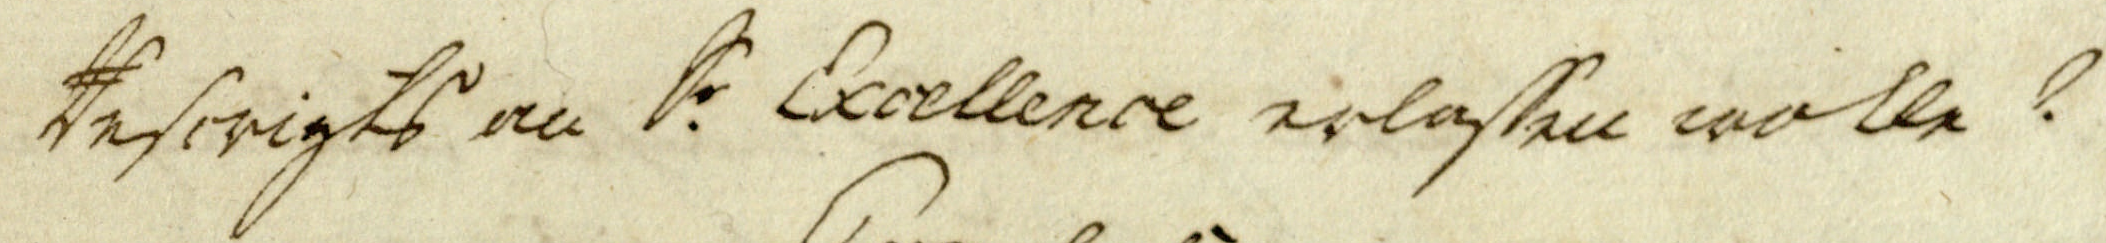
Rescripts an Sr. Excellence erlassen wolle!
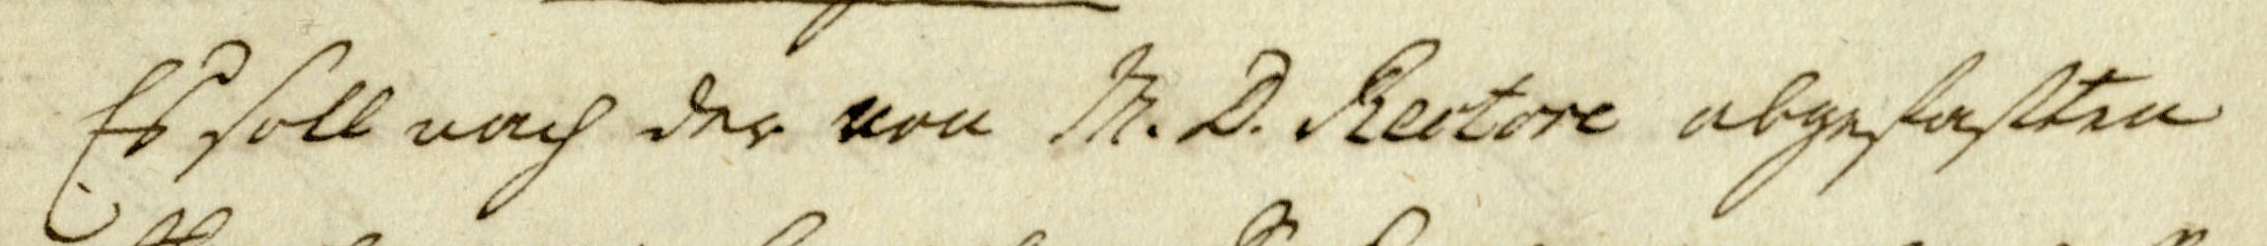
Es soll nach der von M. D. Rectore abgefaßten
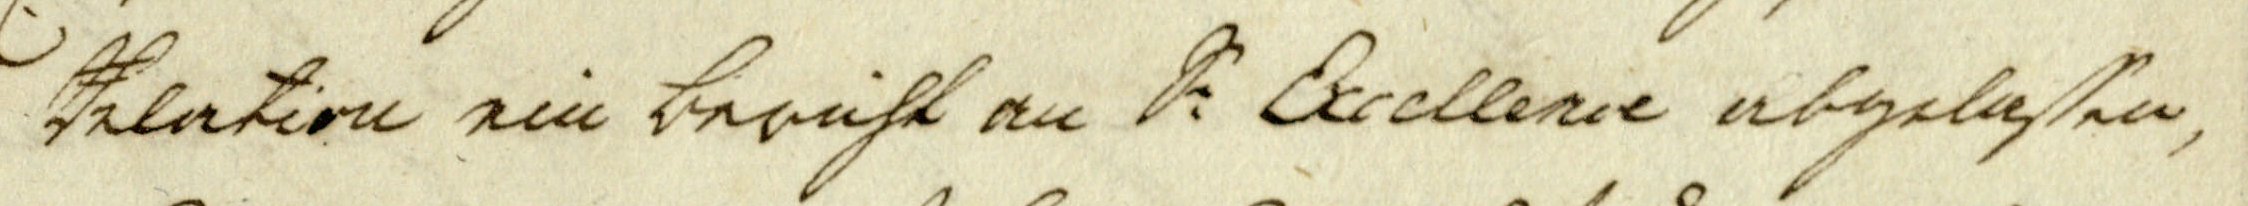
Relation ein Bericht an Sr. Excellence abgelassen,
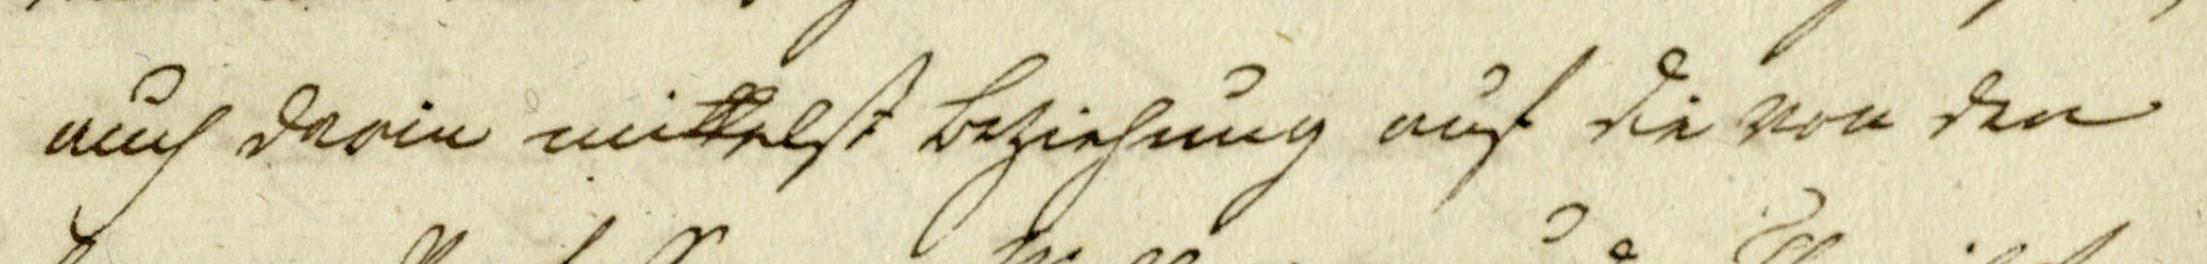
auch darin mittelst Beziehung auf die von den
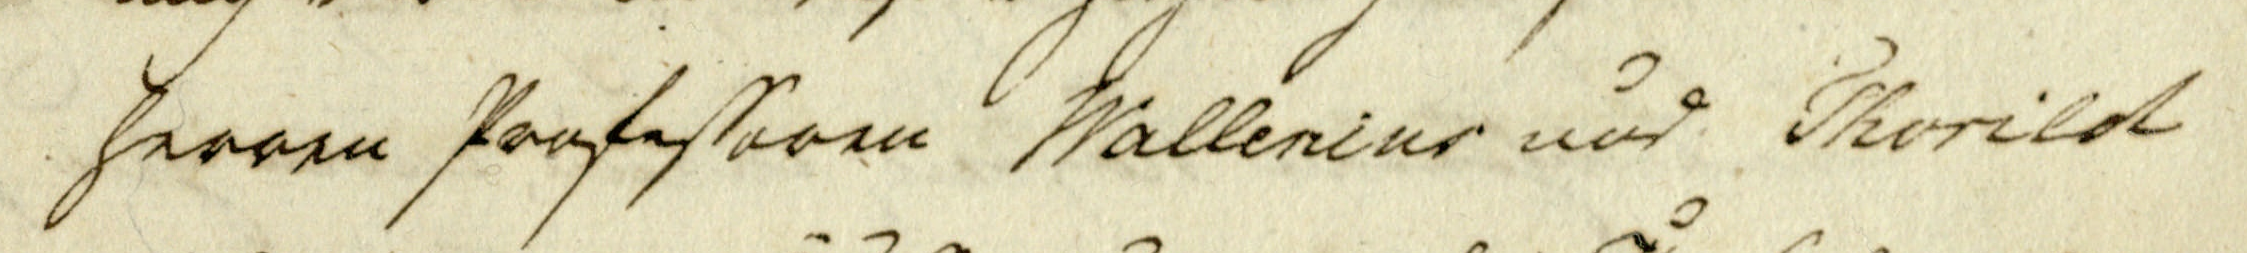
herren Professoren Wallenius und Thorild
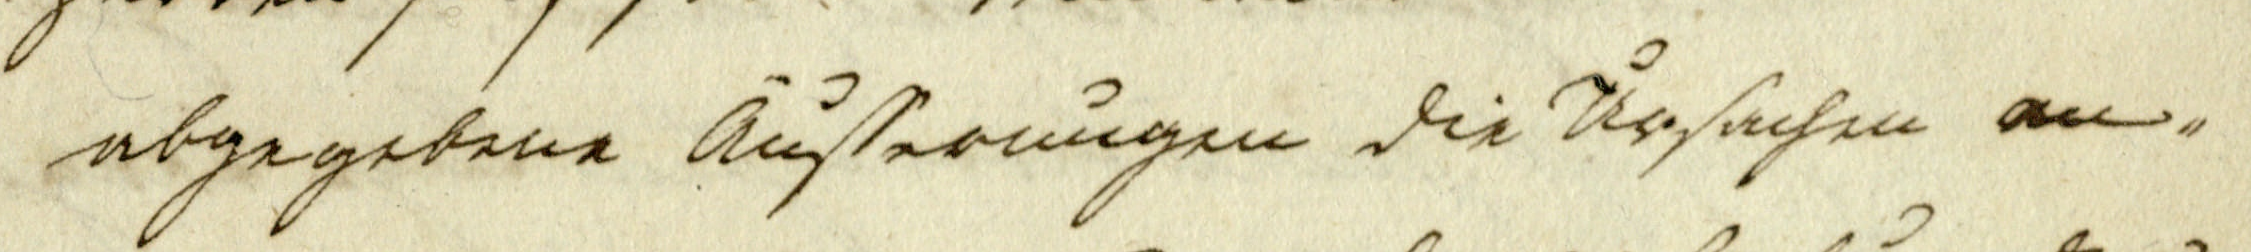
abgegebene Äusserungen die Ursachen an¬
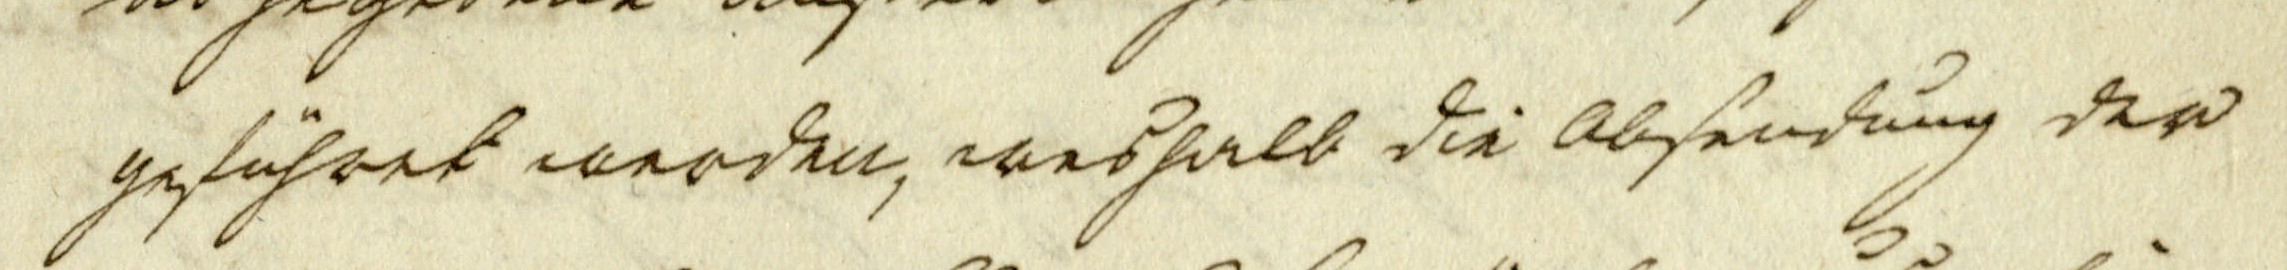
geführet werden, weshalb die Absendung der
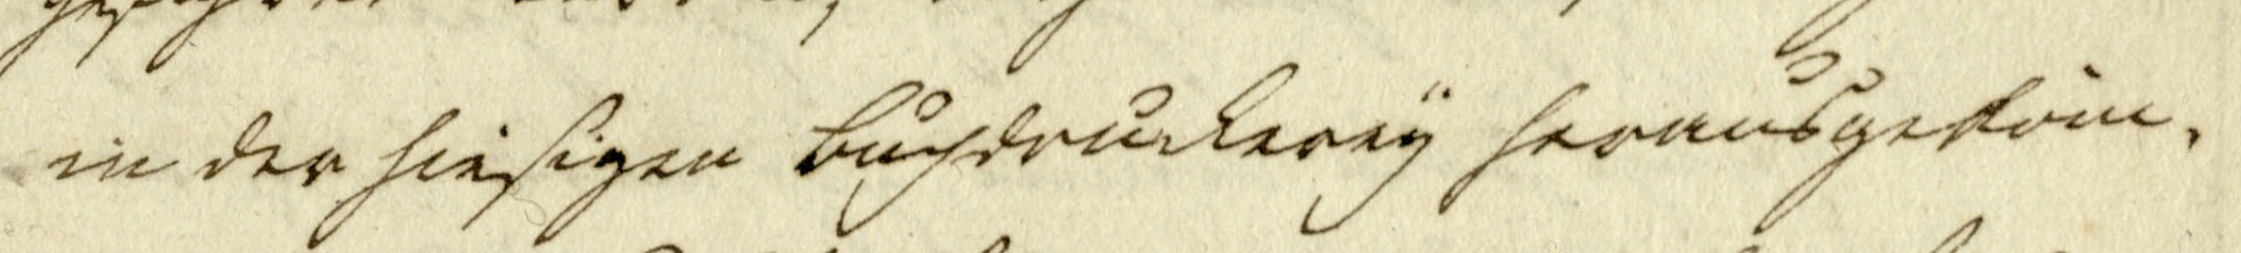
in der hiesigen Buchdruckereÿ herausgekom¬
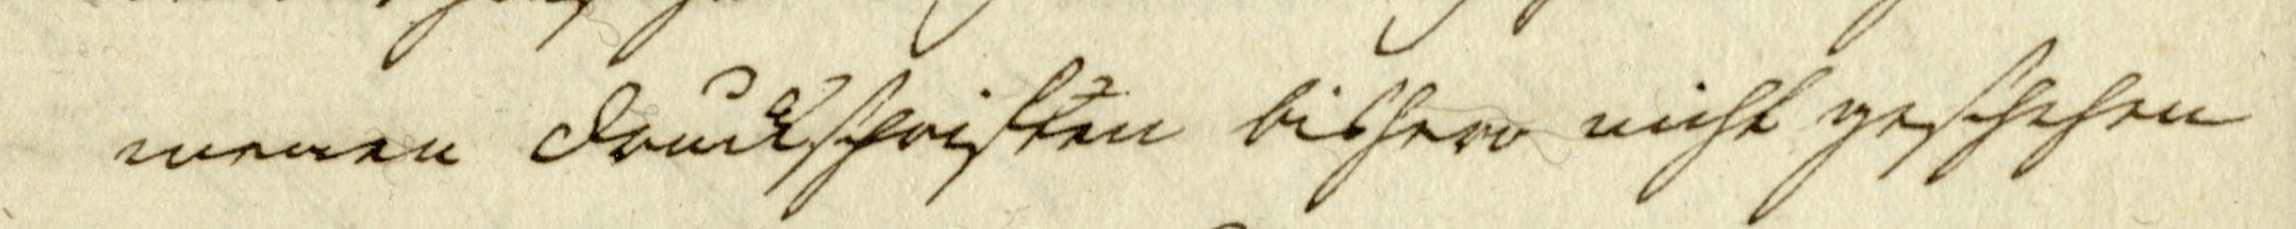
menen Druckschriften bisher nicht geschehen
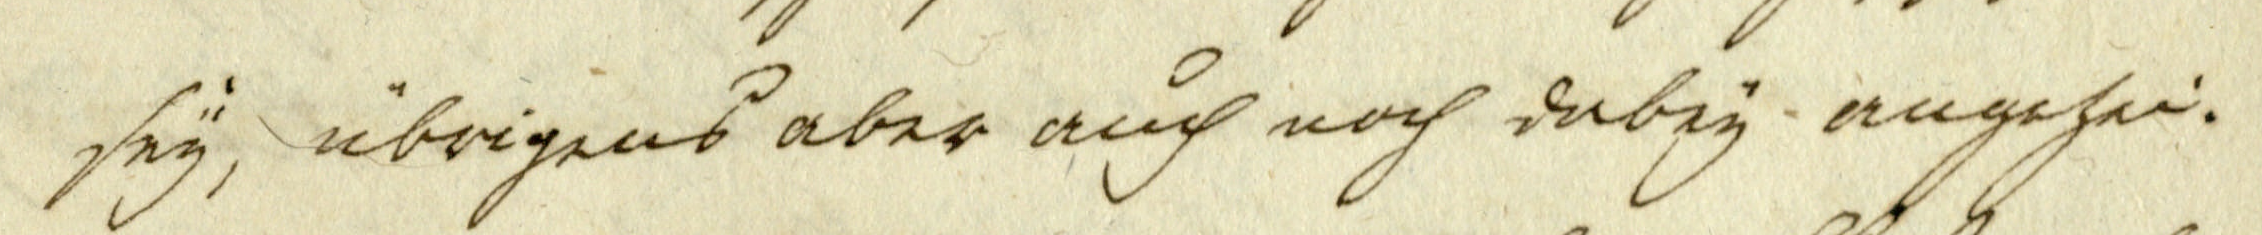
seÿ, übrigens aber auch noch dabeÿ angezei¬
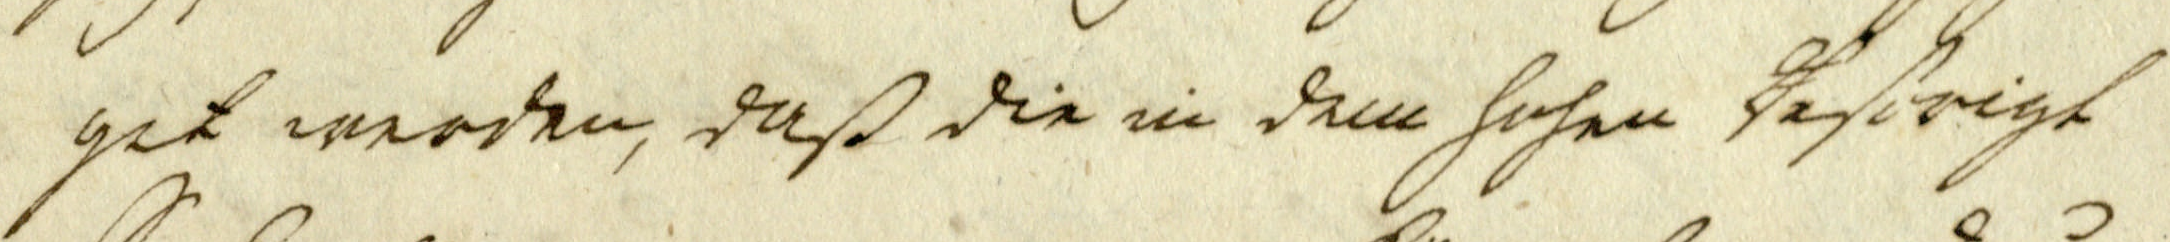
get werden, daß die in dem hohen Rescript
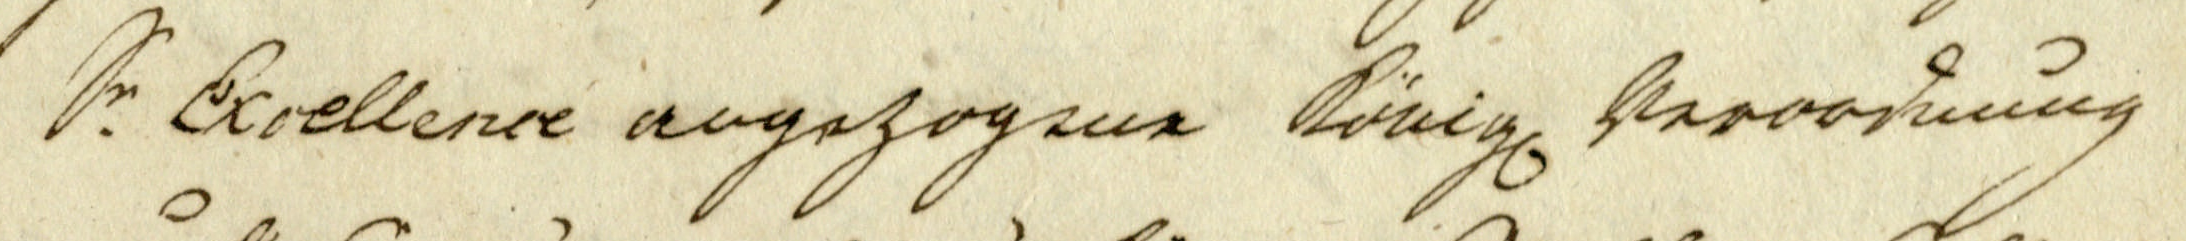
Sr. Excellence angezogene Königl. Verordnung
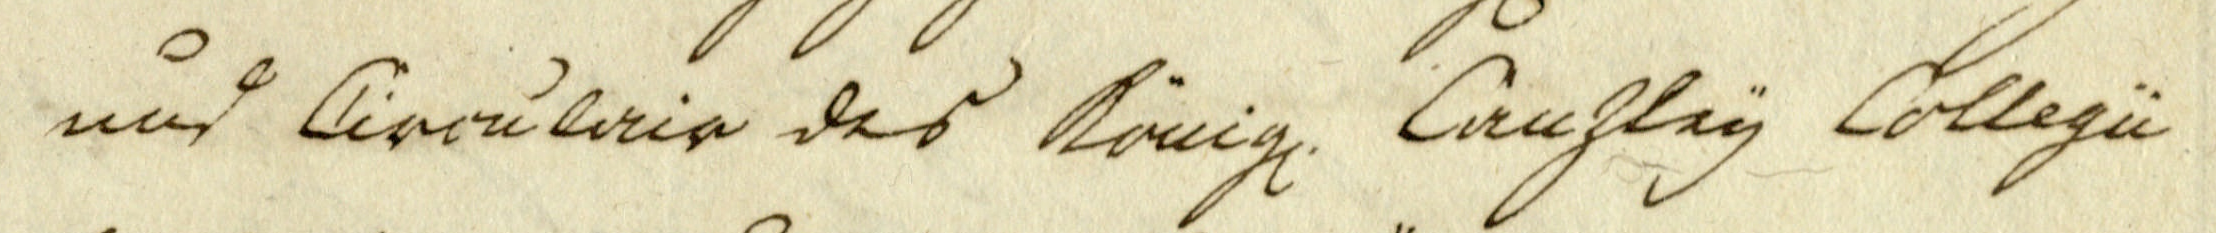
und Circulair des Königl. Cancleÿ Collegii
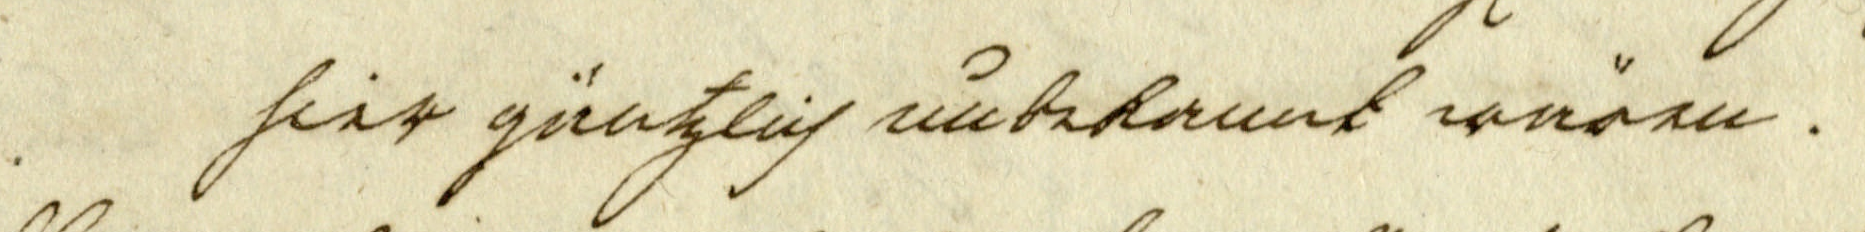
hier gäntzlich unbekannt wären.
